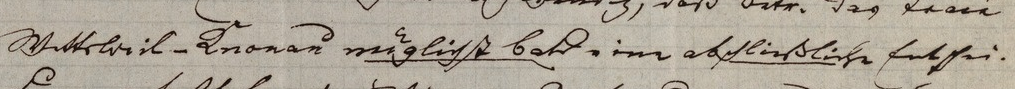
Wettsweil–Knonaumöglichst bald eine abschließliche Entschei-
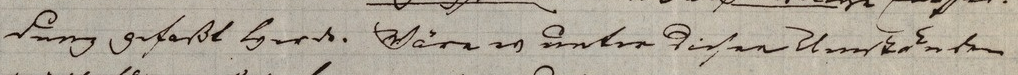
dung gefaßt werde. Wäre es unter diesen Umständen
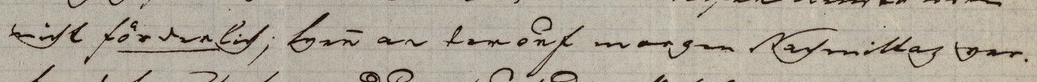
nicht förderlich, wenn an der auf morgen Nachmittag ver-
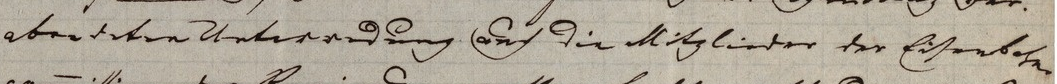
abredeten Unterredung auch die Mitglieder der Eisenbahn-
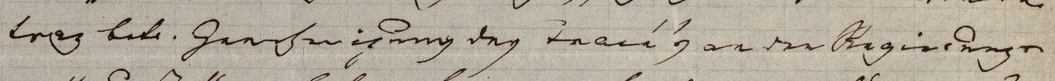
trag betr. Genehmigung des Tracé's an den Regierungs-
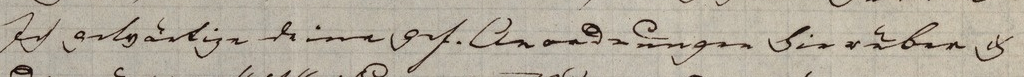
Ich gewärtige Deine gef. Anordnungen hierüber &
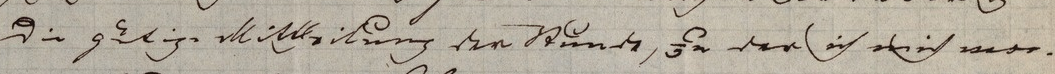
die gütige Mittheilung der Stunde, zu der ich mich mor-
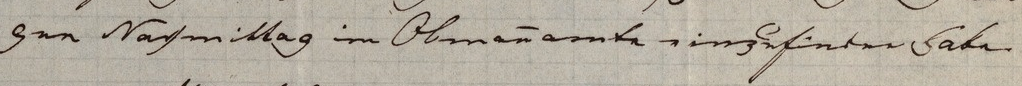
gen Nachmittag im Obmannamte einzufinden habe.
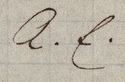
A. E.
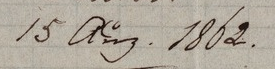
15 Aug. 1862.
